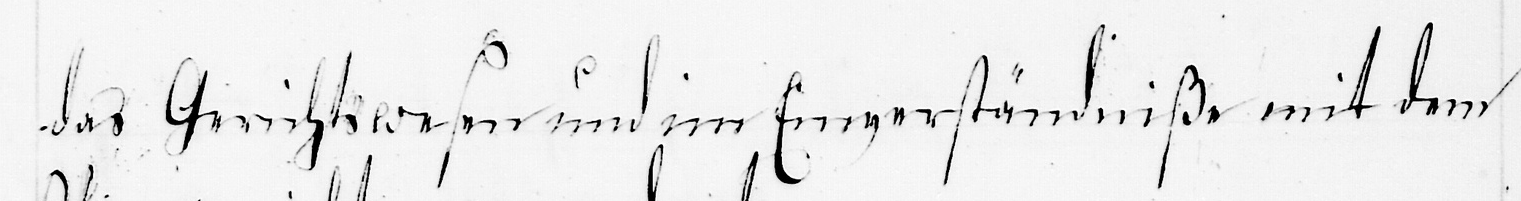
das Gerichtswesen und im Einverständniße mit dem
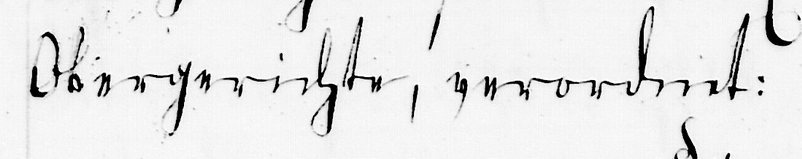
Obergerichte, verordnet:
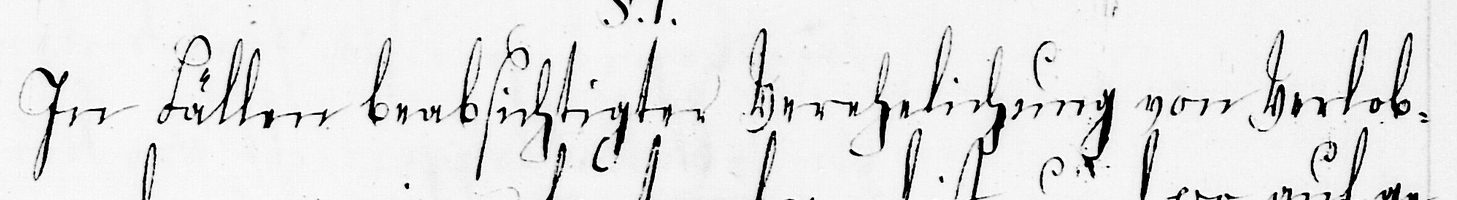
In Fällen beabsichtigter Verehelichung von Verlob¬
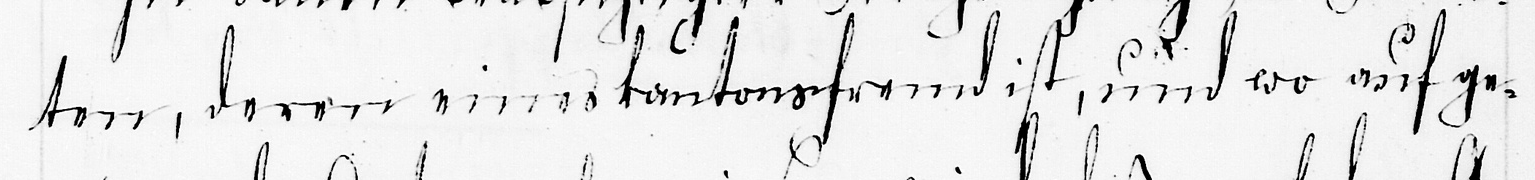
ten, deren eines kantonsfremd ist, und wo auf ge¬
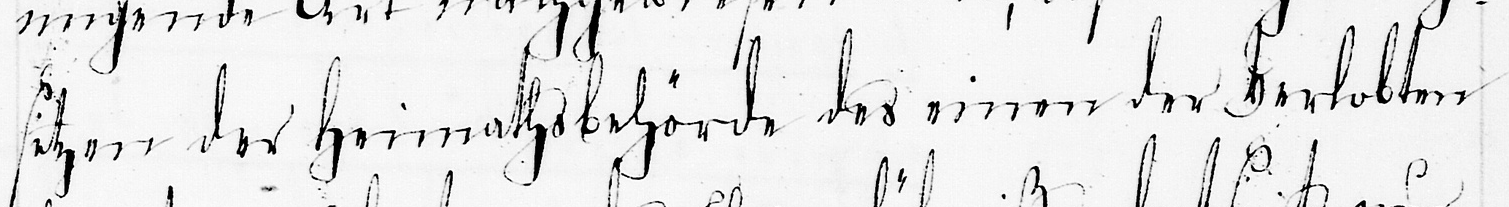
setzen der Heimathsbehörde des einen der Verlobten
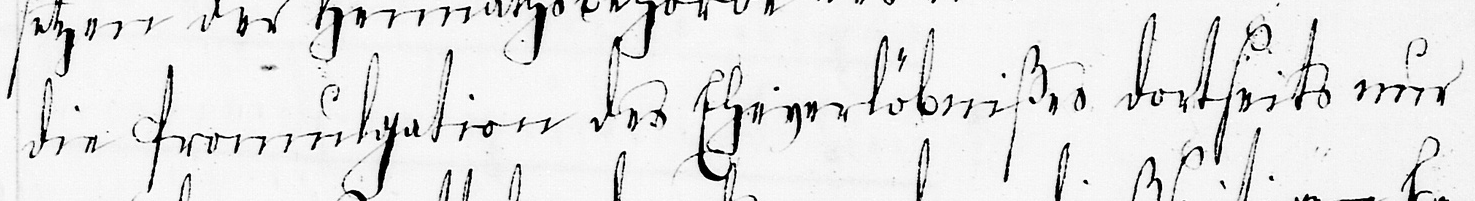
die Promulgation des Eheverlöbnißes dortseits nur
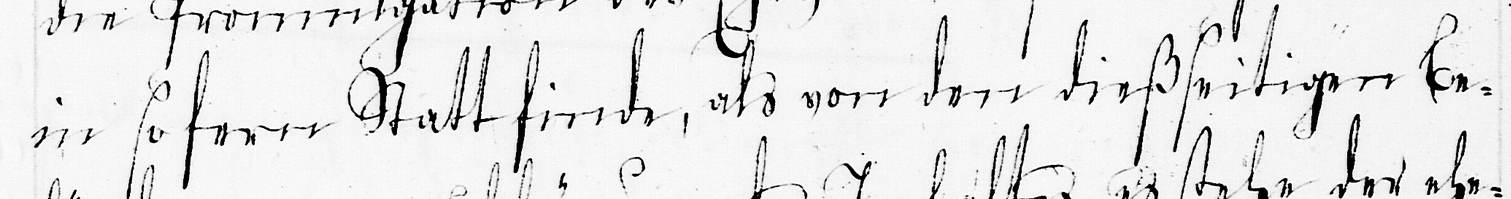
in so fern Statt finde, als von dem dießseitigen Be¬
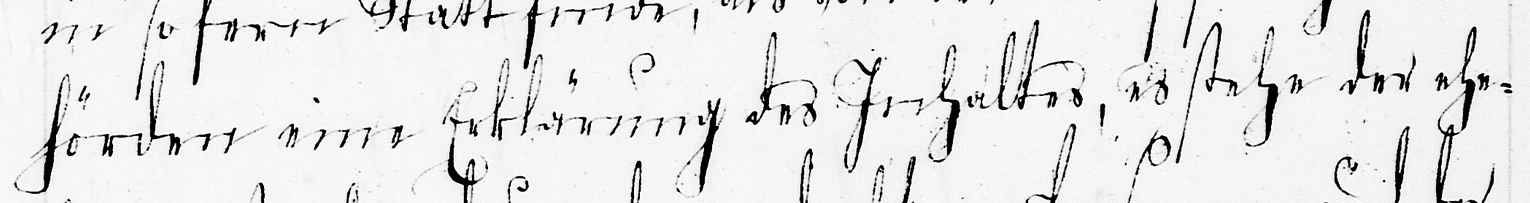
hörden eine Erklärung des Inhaltes, es stehe der ehe¬
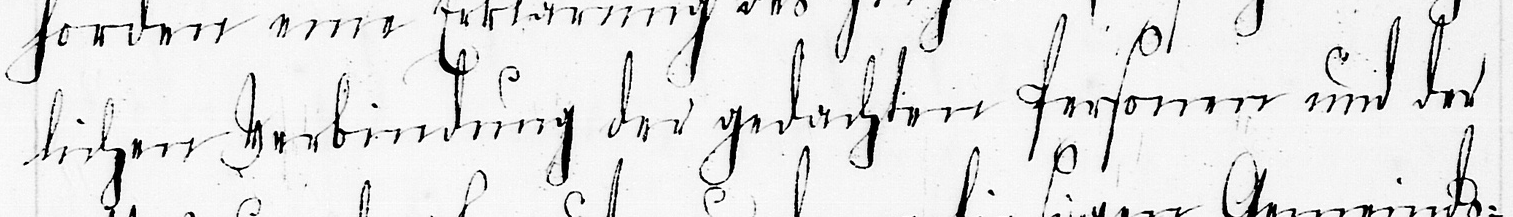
lichen Verbindung der gedachten Personen und der
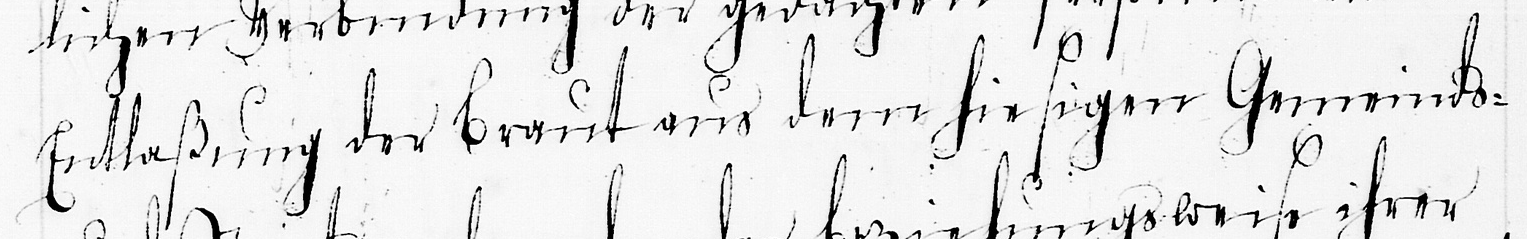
Entlaßung der Braut aus dem hiesigen Gemeinds-
